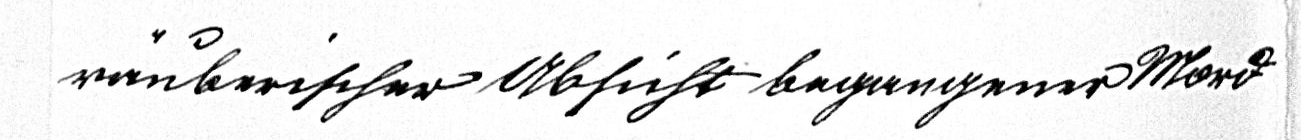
räuberischer Absicht begangener Mord
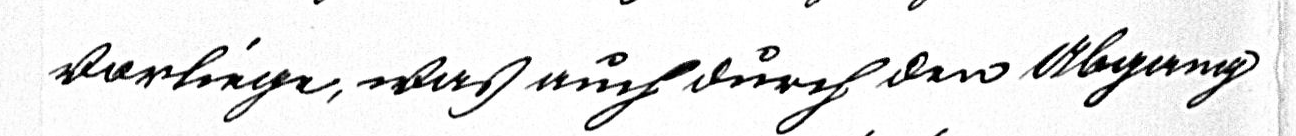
vorliege, was auch durch den Abgang
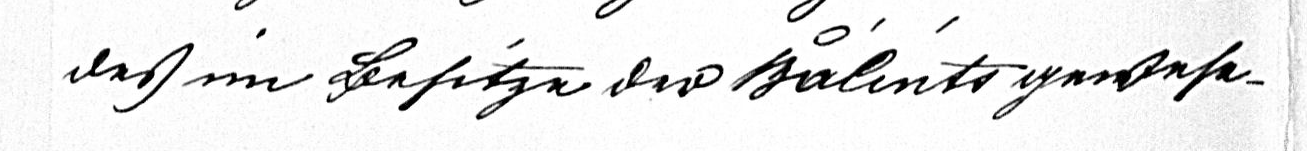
des im Besitze der Bálints gewese¬
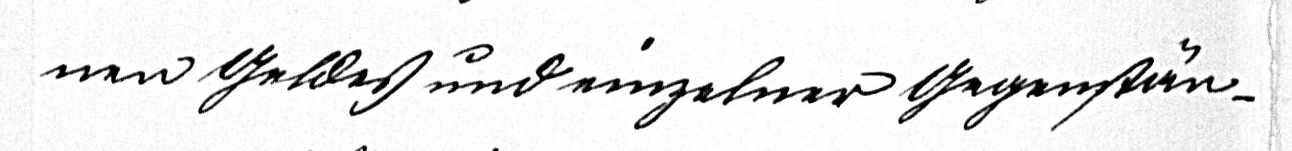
nen Geldes und einzelner Gegenstän¬
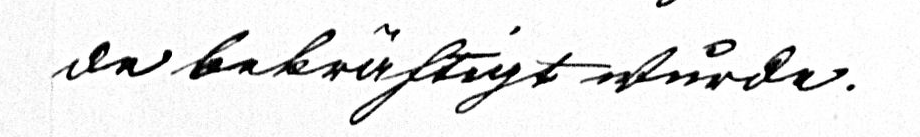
de bekräftigt wurde.
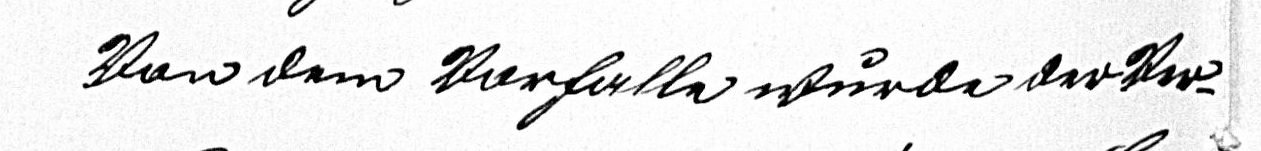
Von dem Vorfalle wurde der Ver¬
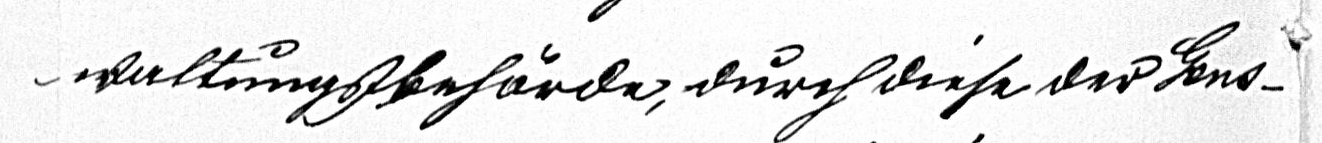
waltungsbehörde, durch diese der Gens¬
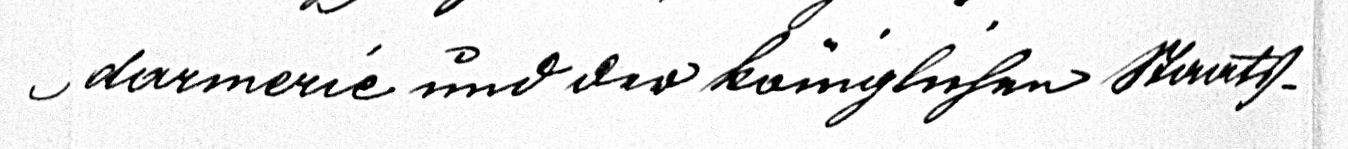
darmerie und der königlichen Staats¬
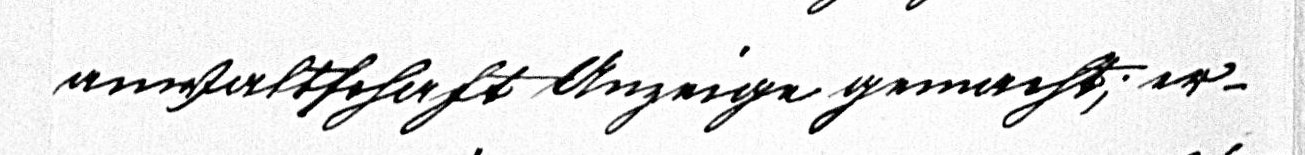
anwaltschaft Anzeige gemacht; er¬
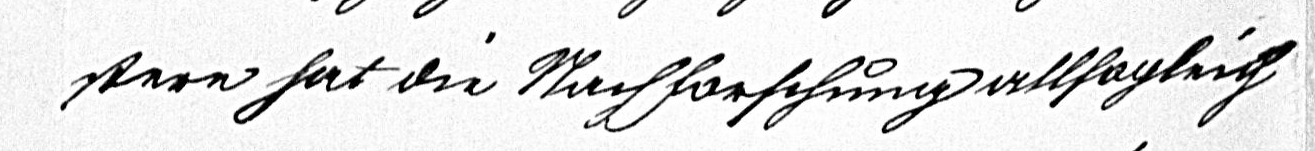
stere hat die Nachforschung allsoleich
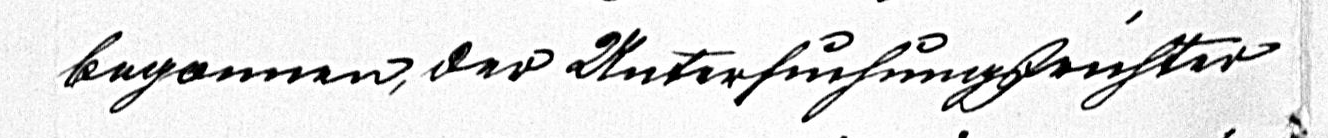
begonnen, der Untersuchungsrichter
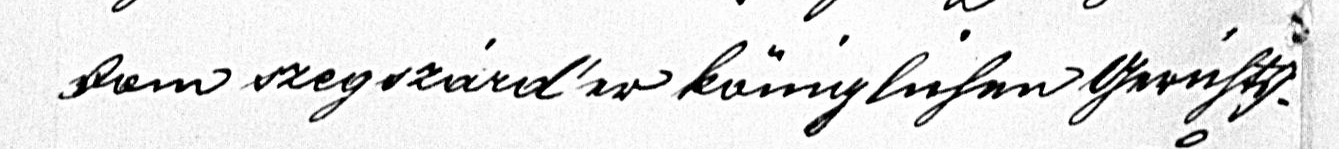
vom szegszárd'er königlichen Gerichts¬
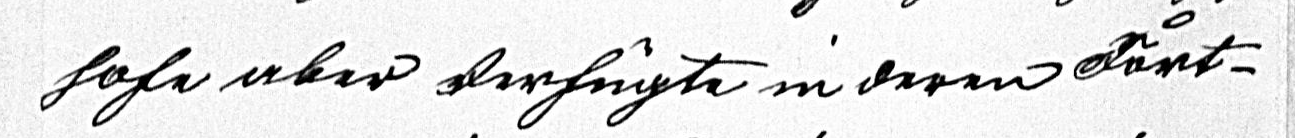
hofe aber verfügte in deren Fort¬
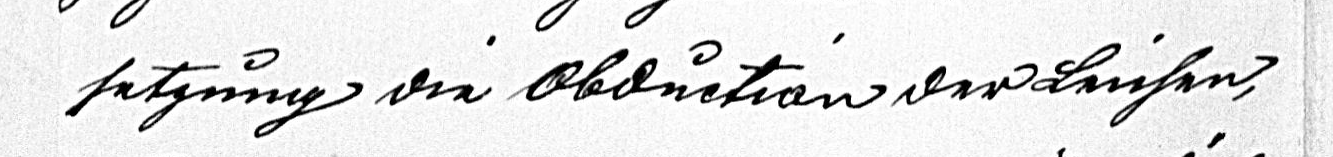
setzung die Obduction der Leichen,
